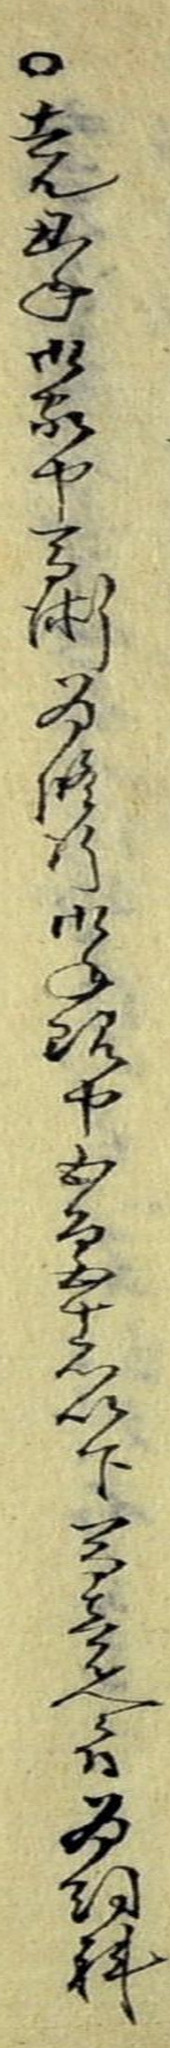○去ル丑年御家中馬術為修行御年限中五百五十石以下馬壱疋に付為飼料

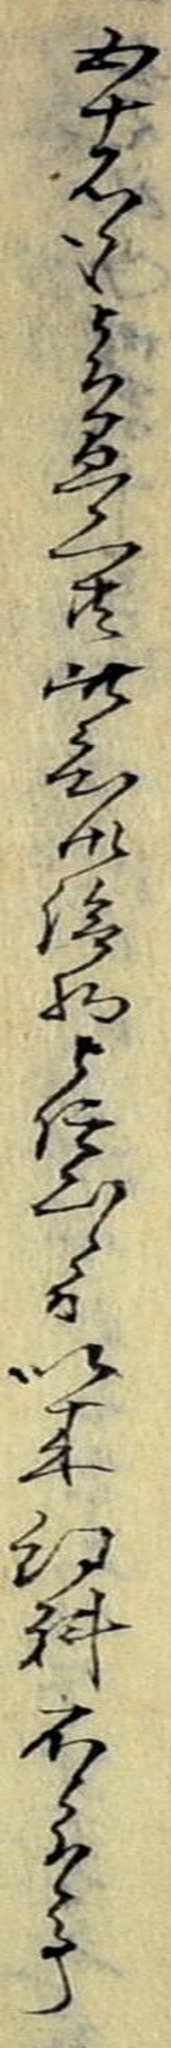五十石つヽ被下置候へ共此度御倹約被仰出候に付以來飼料不被下事
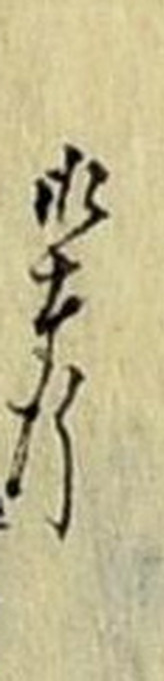御奉行
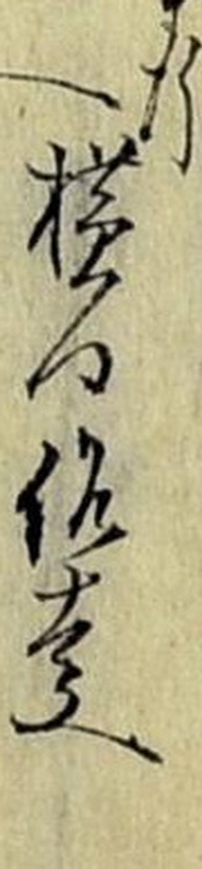横田作太夫
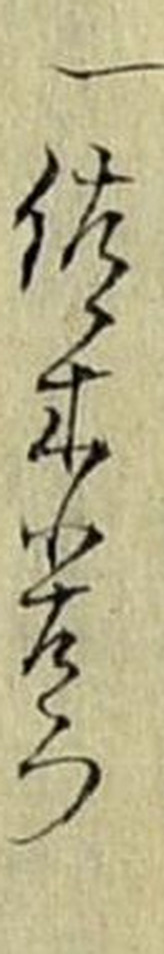佐々木小左衛門
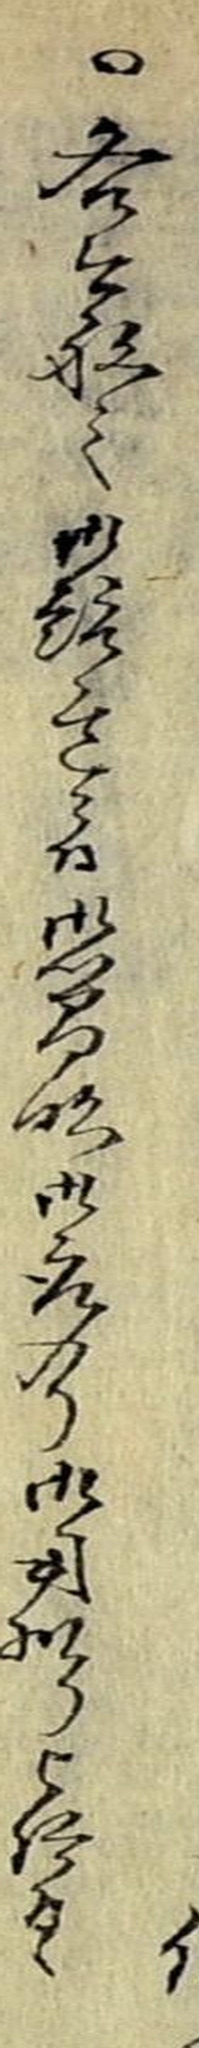○各今般之御趣意に付御簡略御取締り御用掛り被仰付候
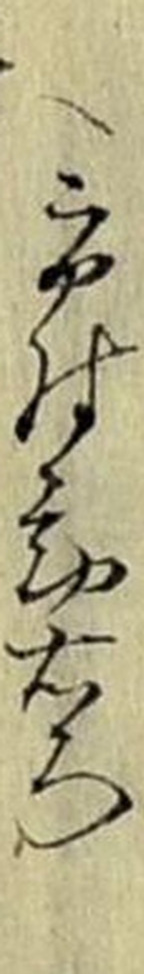同市村勘右衛門
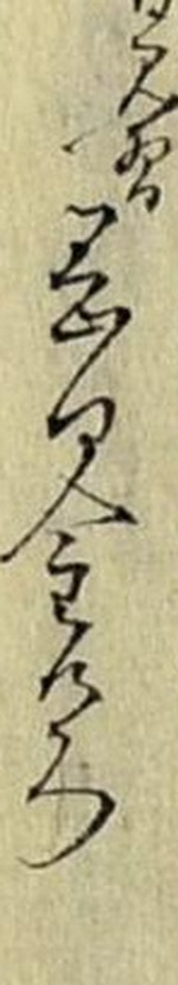岡田金左衛門
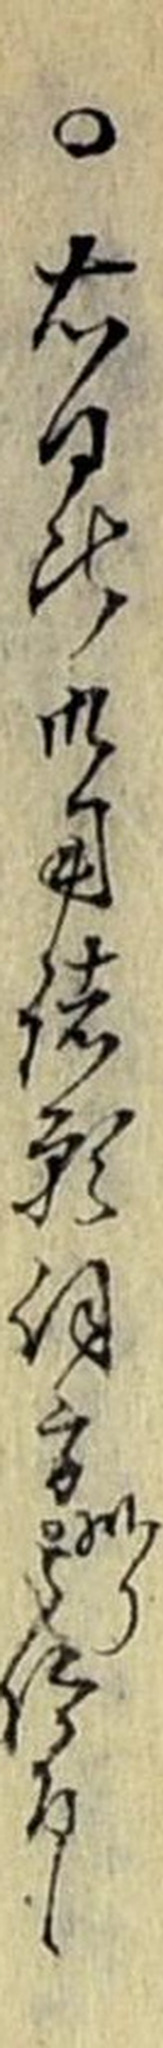○右同断御用諸願伺方掛り被仰付候
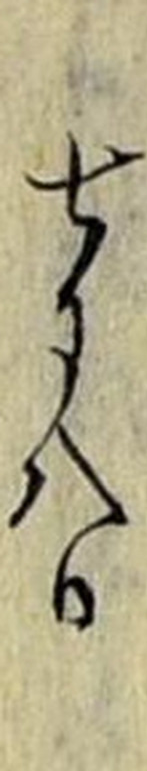七月八日
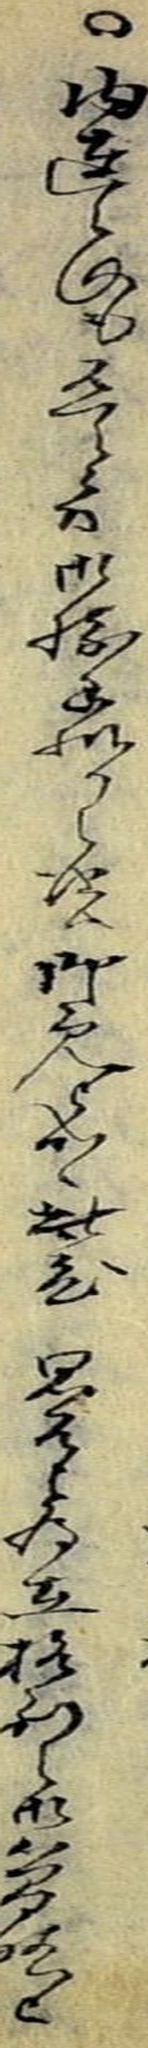○内達之趣も有之候に付御勝手掛り儀は御免被成候此度思召被為在格別之御簡略被
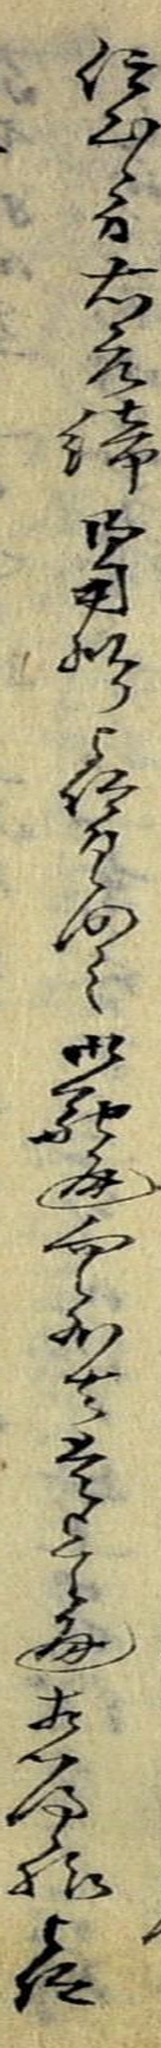仰出に付右取締御用掛り被仰付候仍之御融通向之外は是迄之通相心得候様被仰
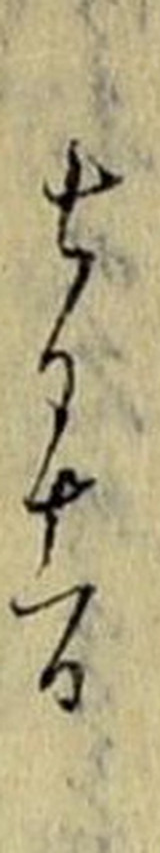七月十一日
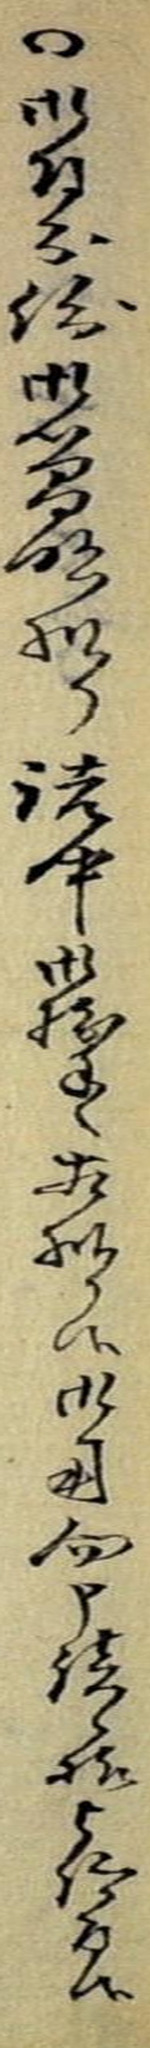○御自分儀御簡略掛り詰中御勝手之相掛り候御用向申談候様被仰付候
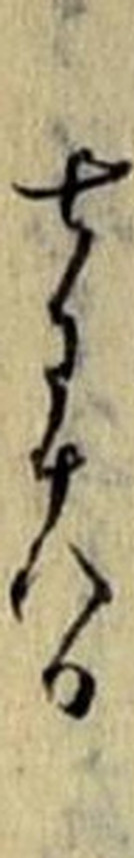七月十八日
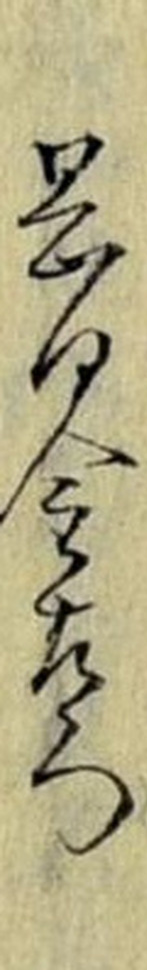岡田金左衛門
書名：命令之部 六
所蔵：福井県文書館 Fukui Prefectural Archives
